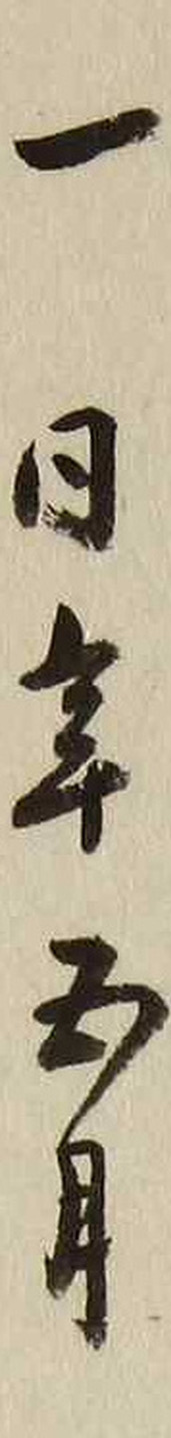一同年五月
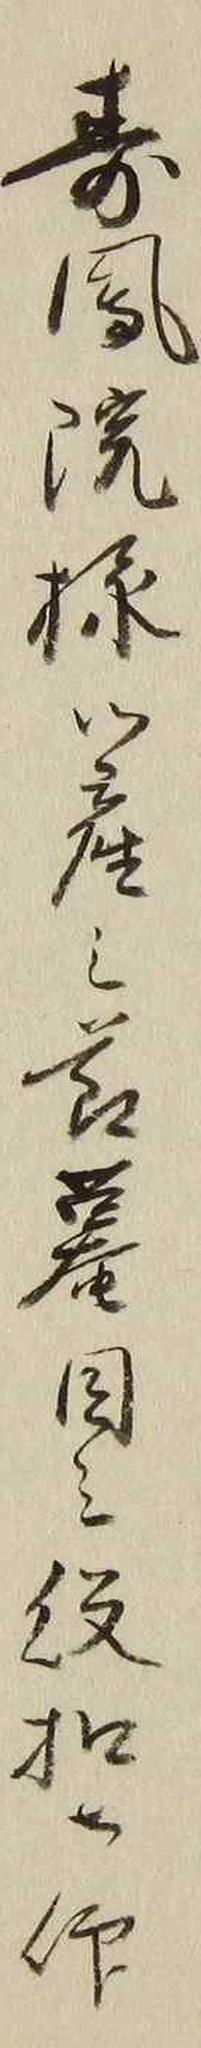寿鳳院様御産之節蟇目之役扣被仰
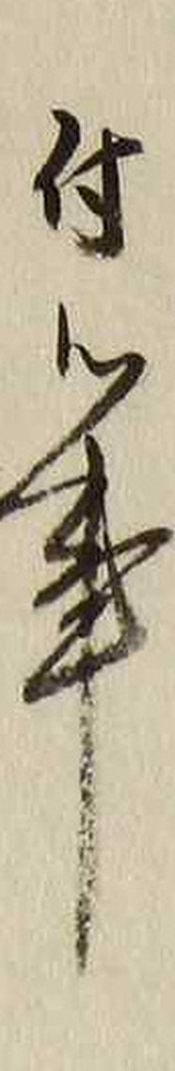付候事
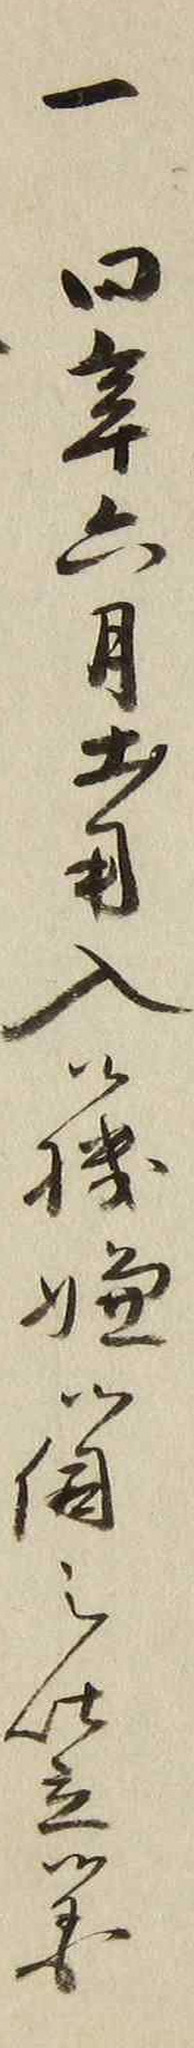一同年六月土用入御機嫌御伺之仕立候にも
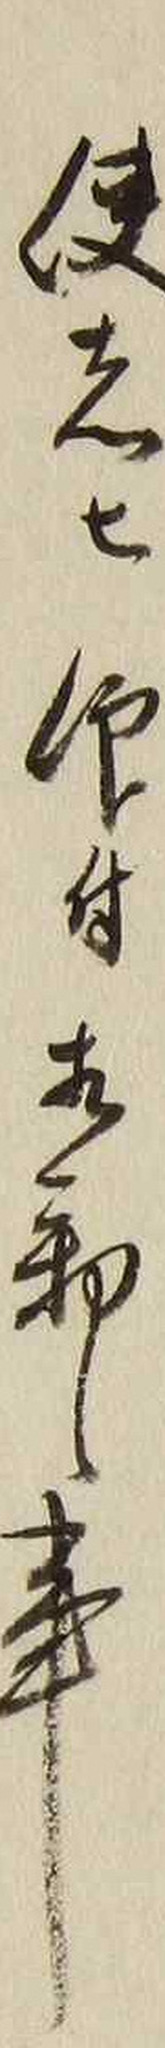使者被仰付相勤候事
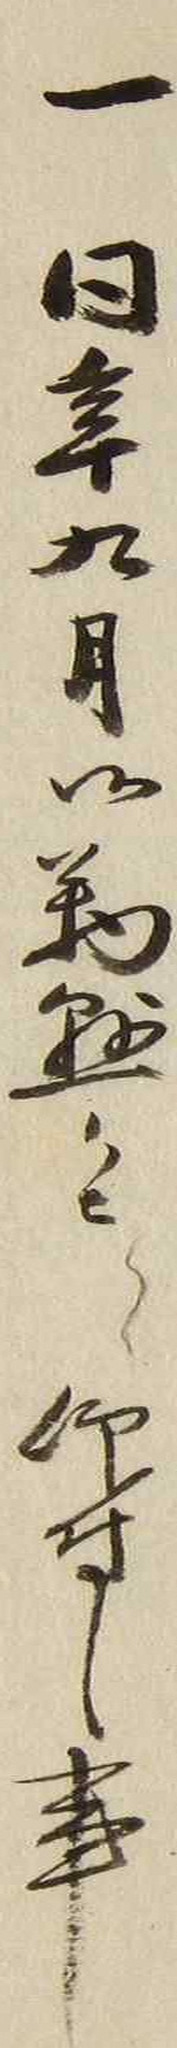一同年九月御勤懸り被仰付候事
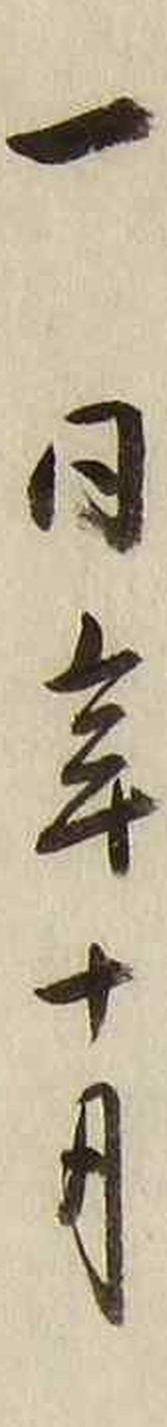一同年十月

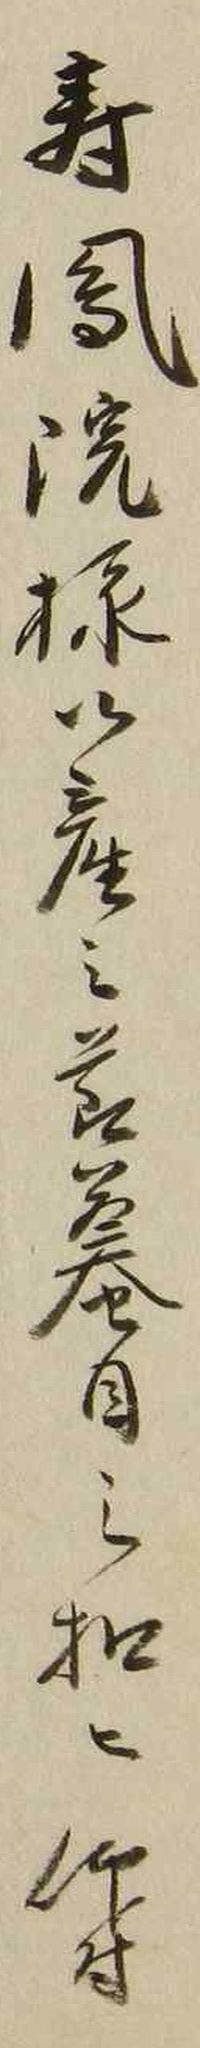寿鳳院様御産之節蟇目之扣被仰付
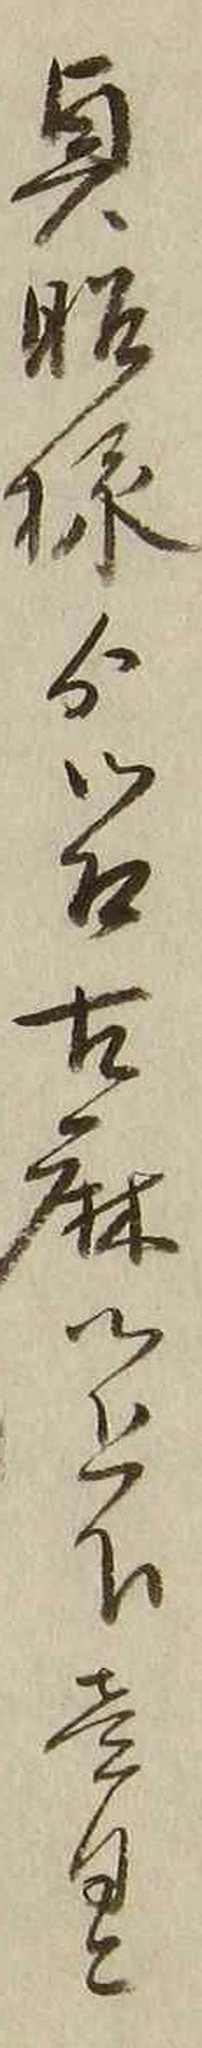貞昭禄ゟ御召古麻御上下壱具
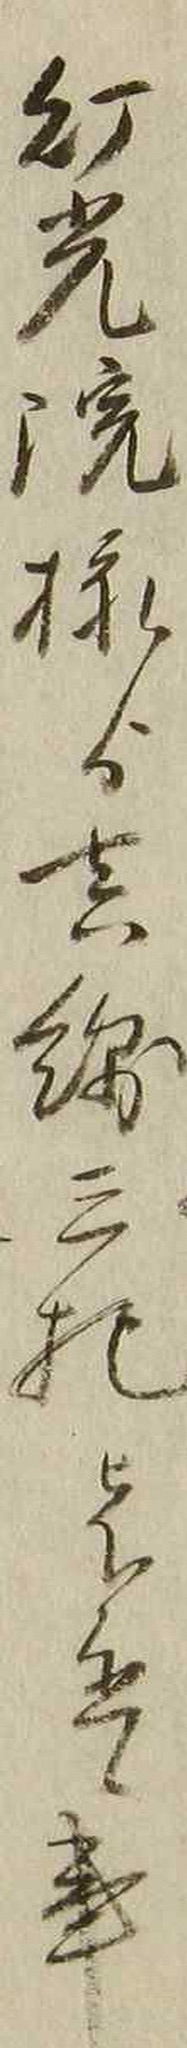幻光院様ゟ真綿三把被下置候事
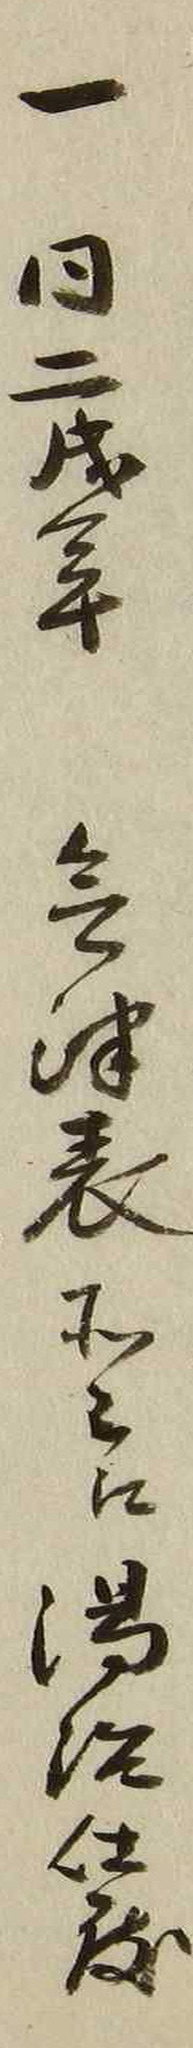一同二戌年会津表所々江湯治仕度
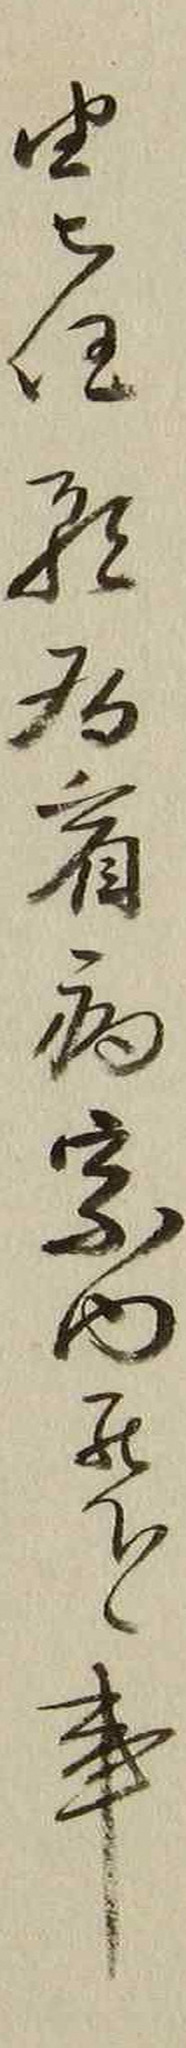由被任願為看病家内罷下候事
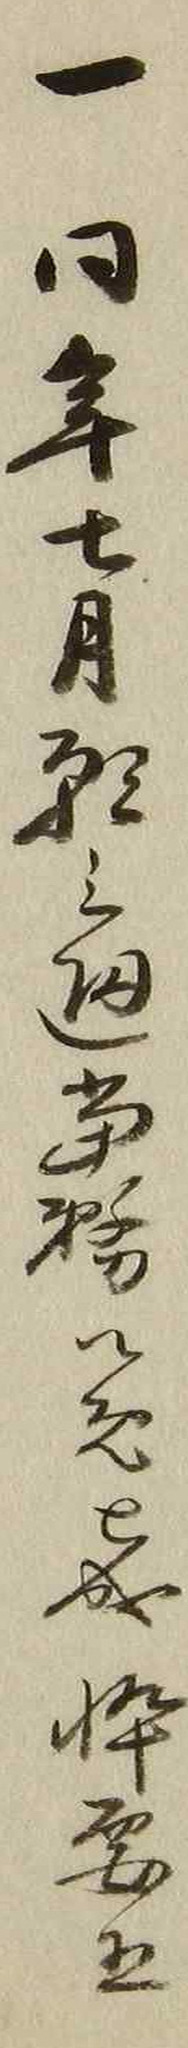一同年七月願之通当務御免被成忰要五
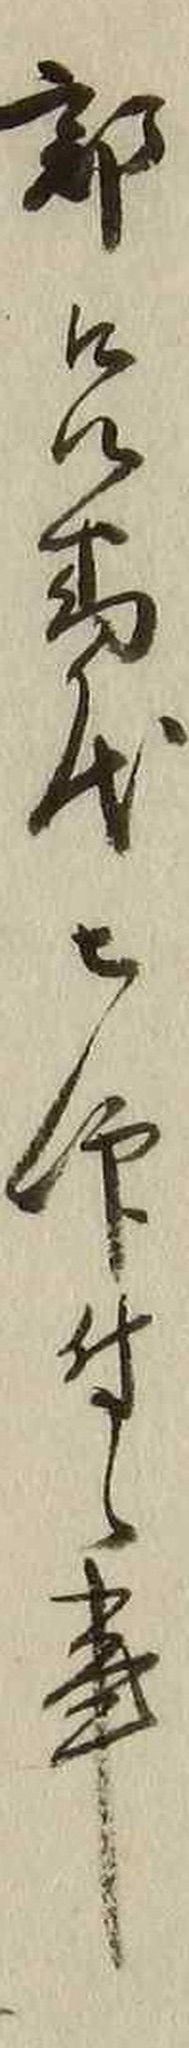郎江御番代被仰付候事
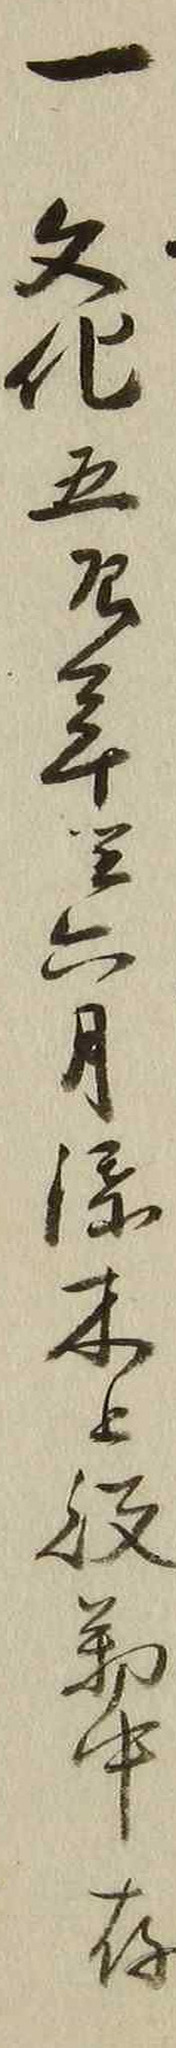一文化五辰年閏六月漆木上役勤中存
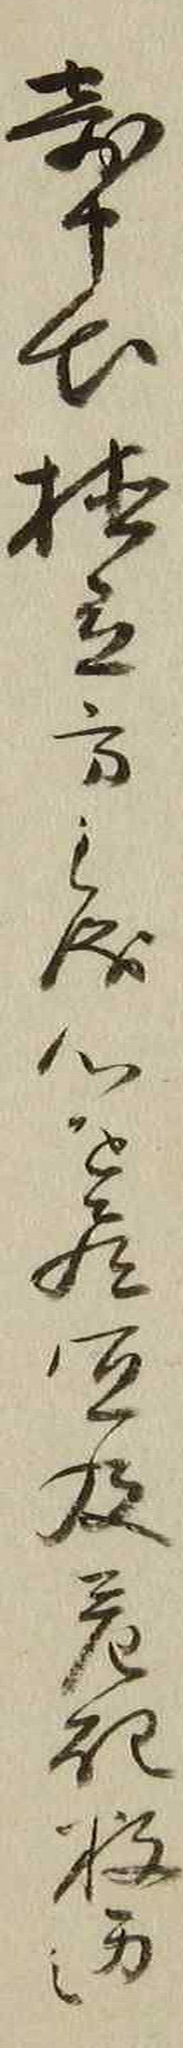寄申出植立方之儀心を尽宜及差配数方之
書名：諸士系譜　巻之311　し之部1
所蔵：会津若松市立会津図書館
